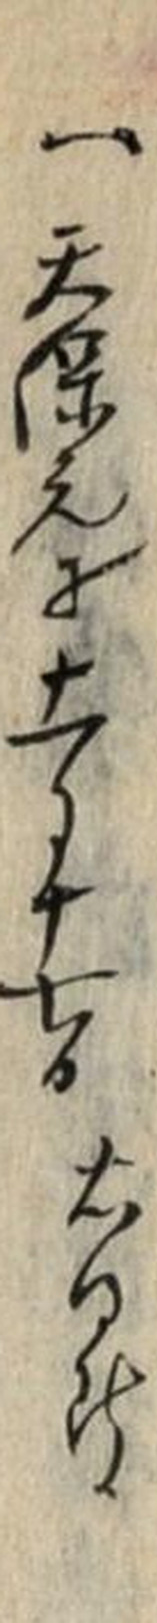一天保元寅十一月十七日右同断
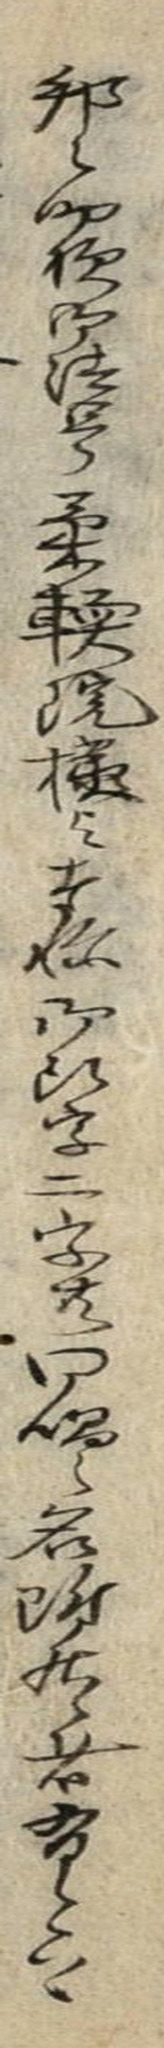邦之助様御法号柔輭院様と奉称候御頭字二字共同唱之名附居候者有之候はゝ
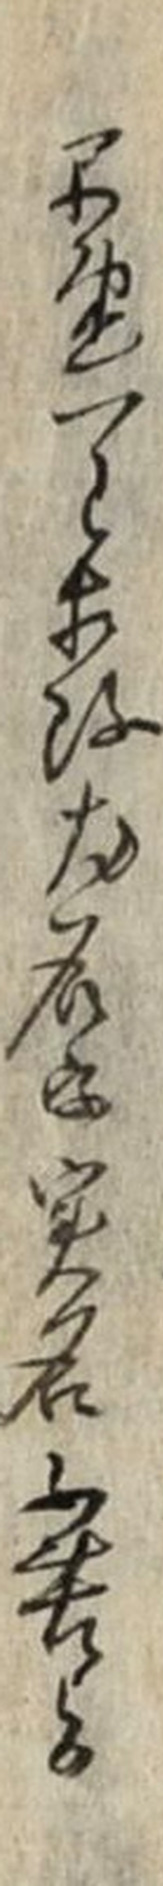早速可相改候尤名字実名不苦旨
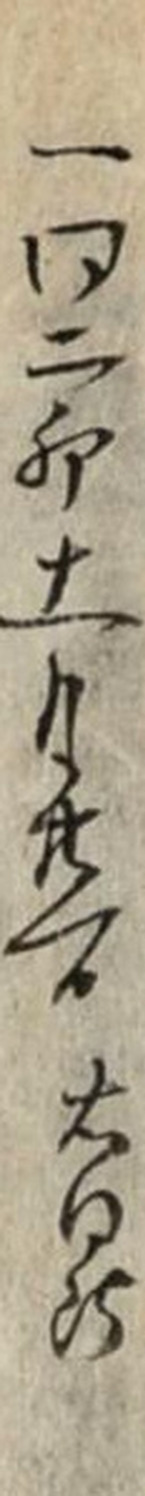一同二卯十一月廿一日右同断
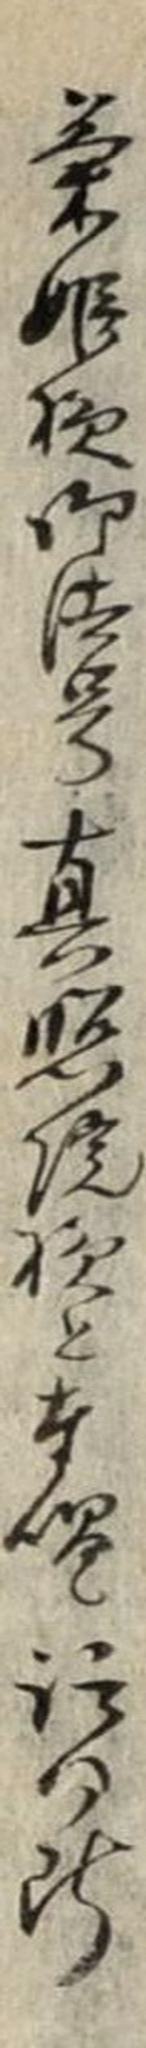菊姫様御法号真照院様と奉唱候跡同断
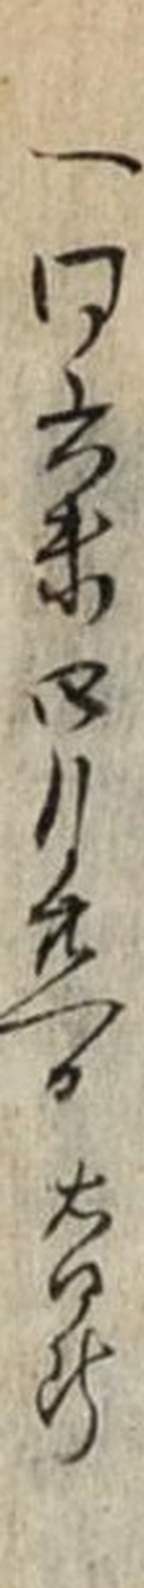一同六未四月廿一日右同断
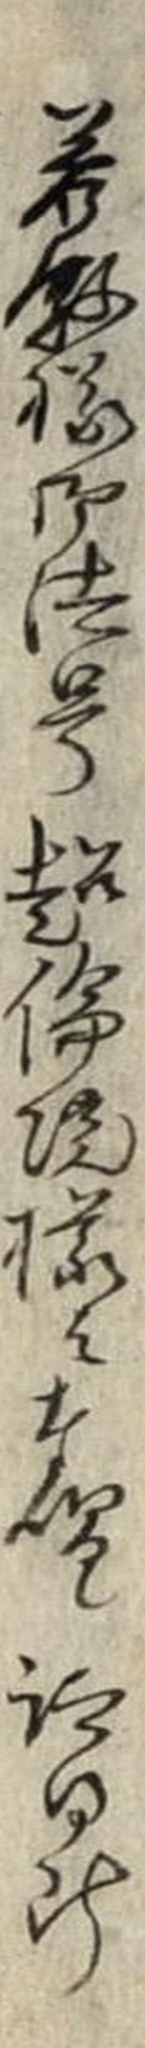若殿様御法号超倫院様と奉唱候跡同断
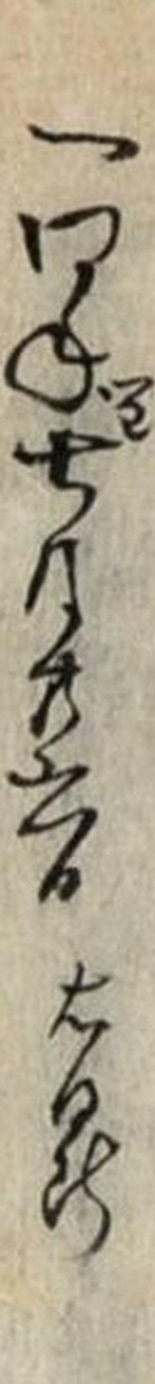一同年閏七月廿六日右同断
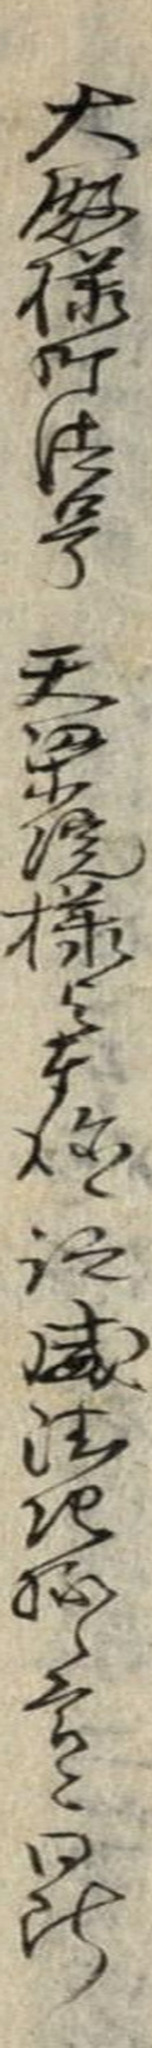大殿様御法号天梁院様と奉称候跡威徳院様之節と同断
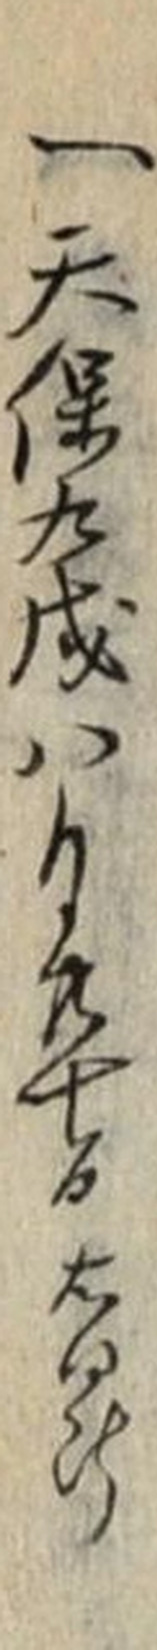一天保九戌八月廿七日右同断
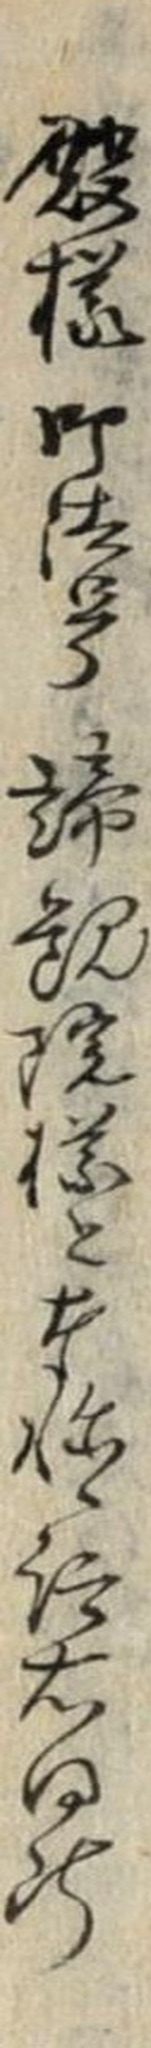殿様御法号諦観院様と奉称候跡右同断
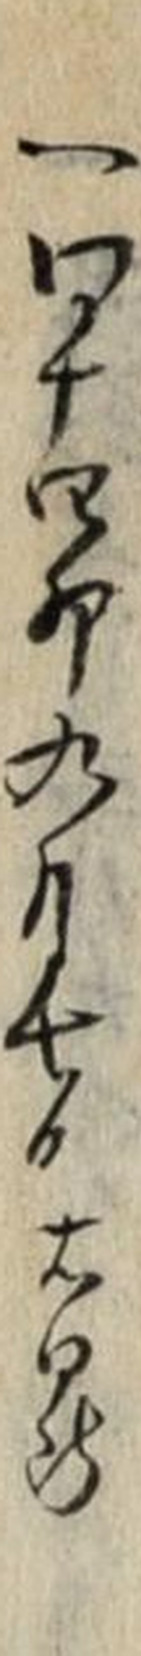一同十四卯九月七日右同断
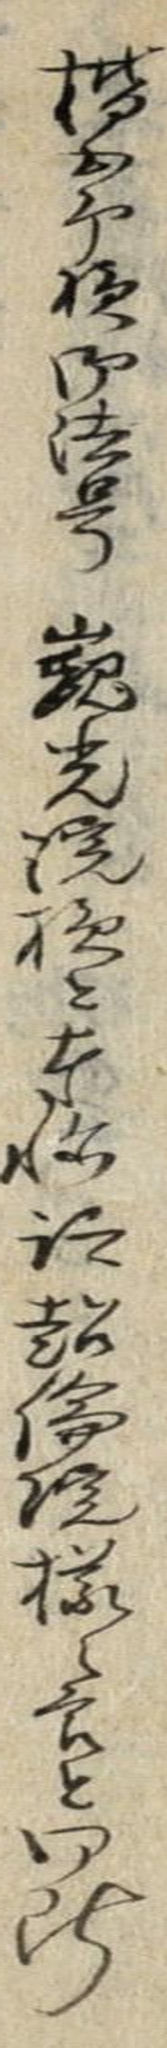楷五郎様御法号巍光院様と奉称跡超倫院様之節と同断

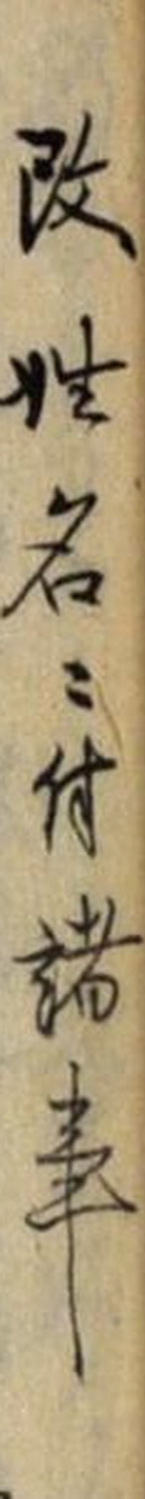改姓名に付諸事
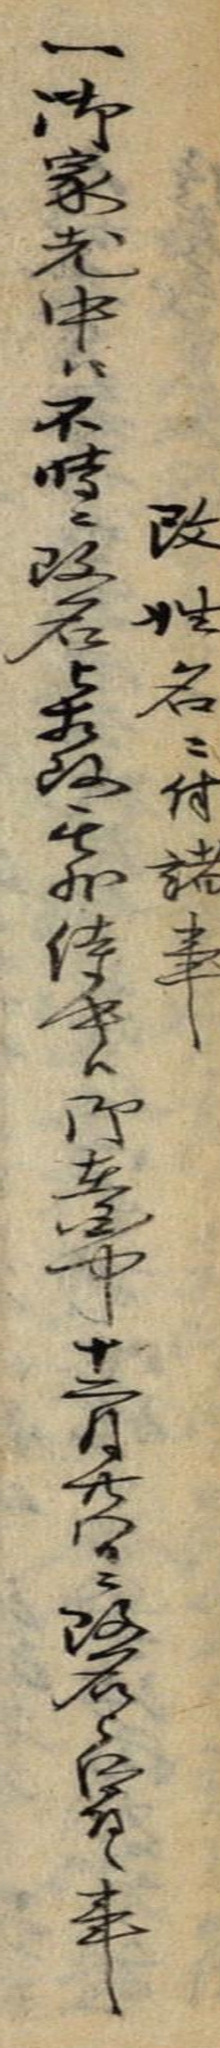一御家老中は不時に改名被相改其外侍中は御在国中十二月廿八日に改名被仰付候事
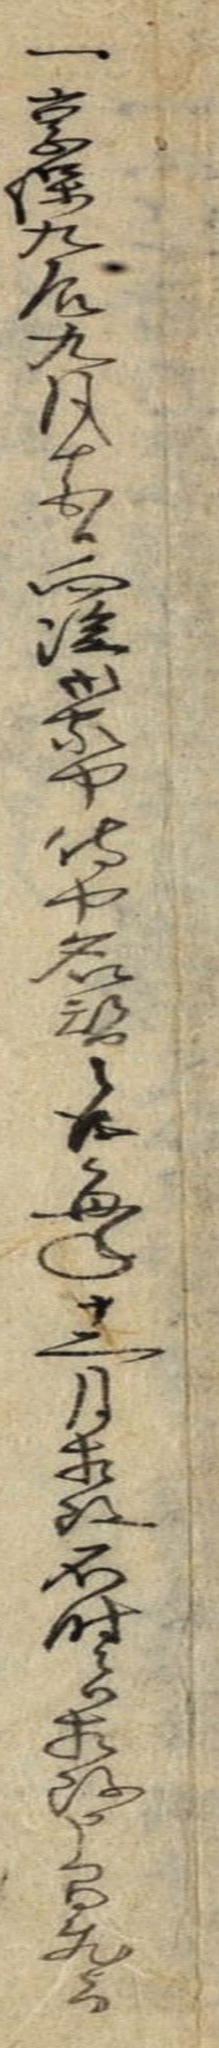一享保九辰九月十五日向後御家中侍中名替之儀毎年十二月相改不時には相改申間敷旨
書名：蒐輯之部
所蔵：福井県文書館 Fukui Prefectural Archives
